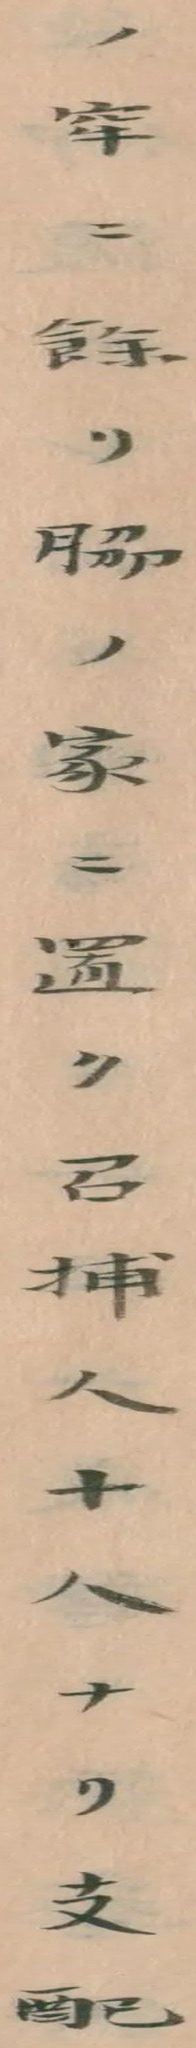ノ牢二余リ脇ノ家二置ク召捕人十八ナリ支配

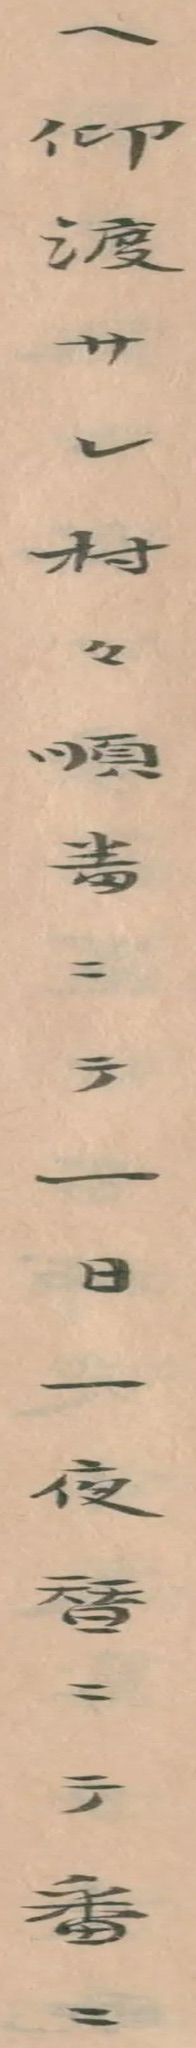へ仰渡サレ村々順番二テ一日一夜替二テ番二
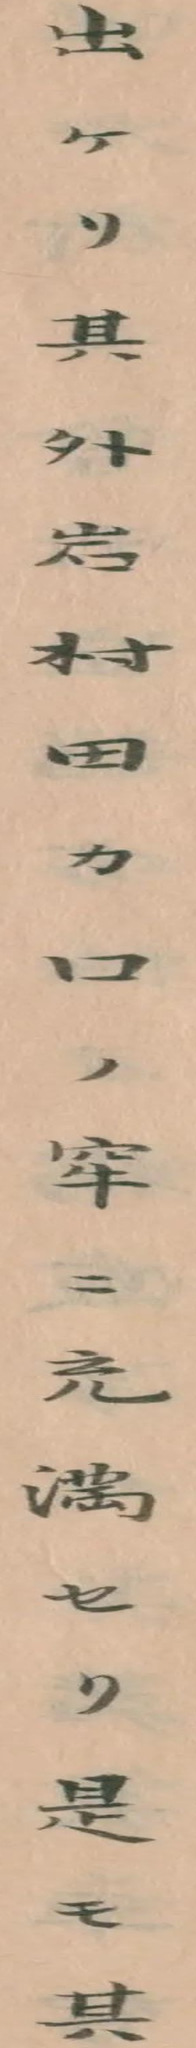出ケリ其外岩村田カ口ノ牢二充満セリ是モ其
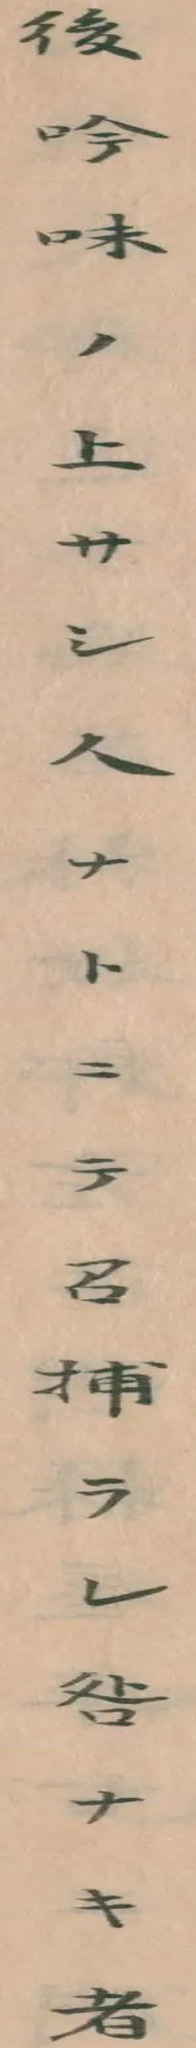後吟味ノ上サシ人ナト二テ召捕ラレ咎ナキ者
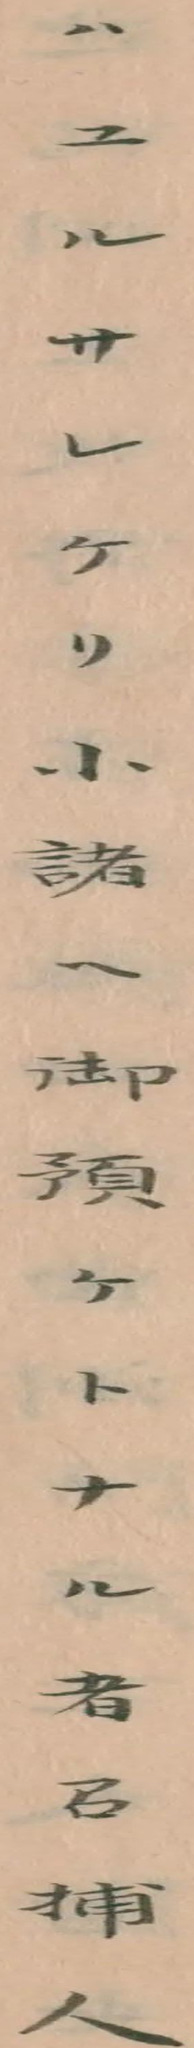ハユルサレケリ小諸江御預ケトナル者召捕人
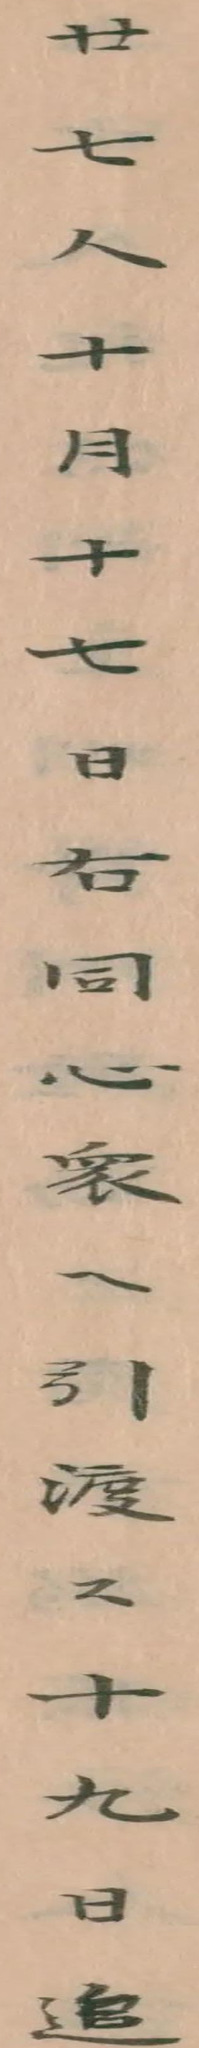廿七人十月十七日右同新衆へ引渡ス十九日追
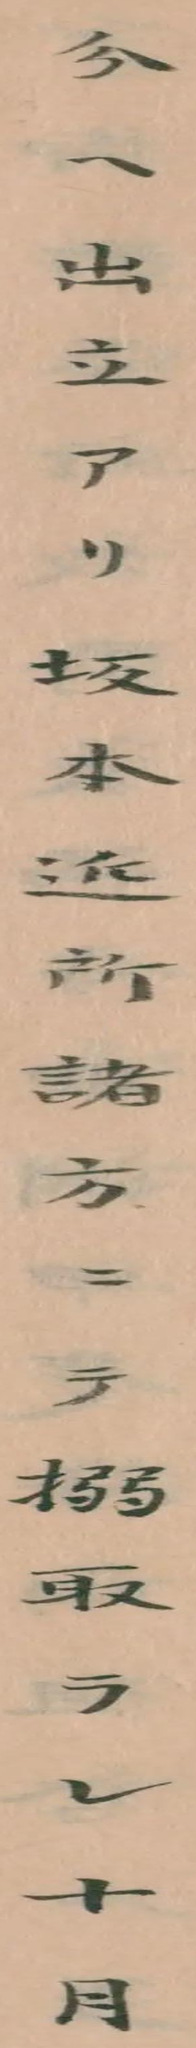分へ出立アリ坂本迄所諸方二テ搦取ラレ十月
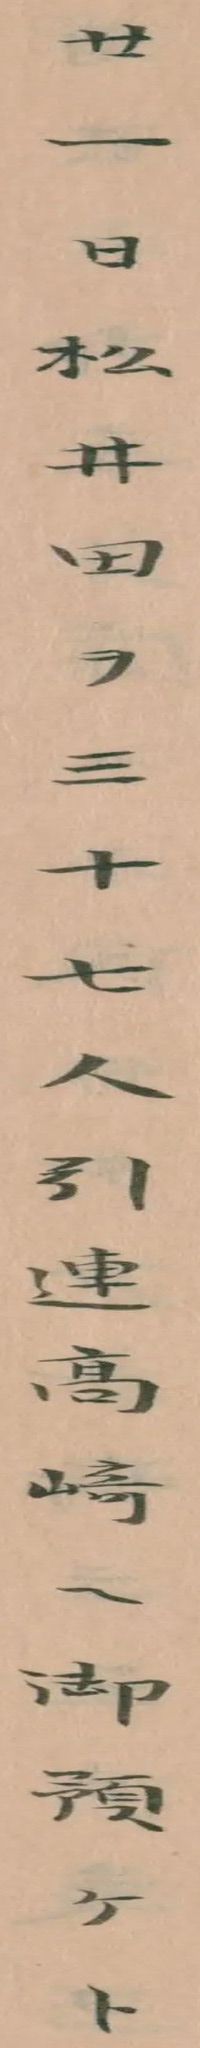廿一日松井田ヲ三十七人引連高崎へ御預ケト
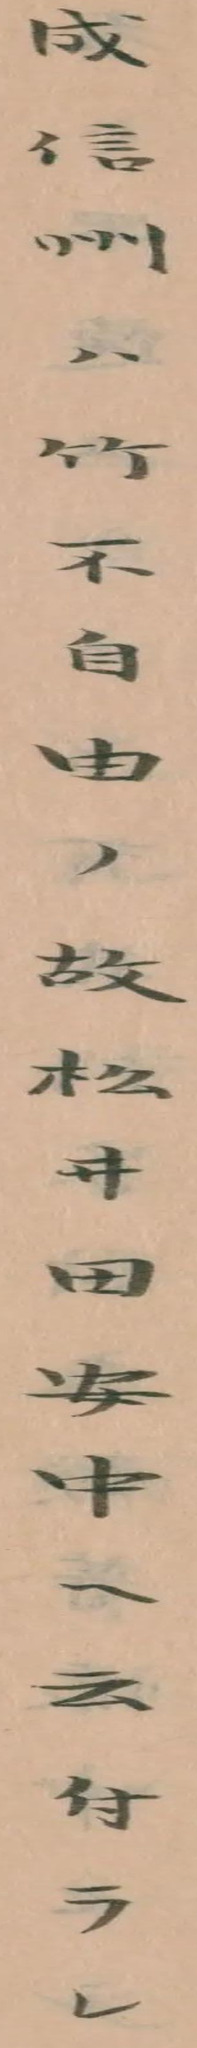成信州ハ竹不自由ノ故松井田安中へ云付ラレ
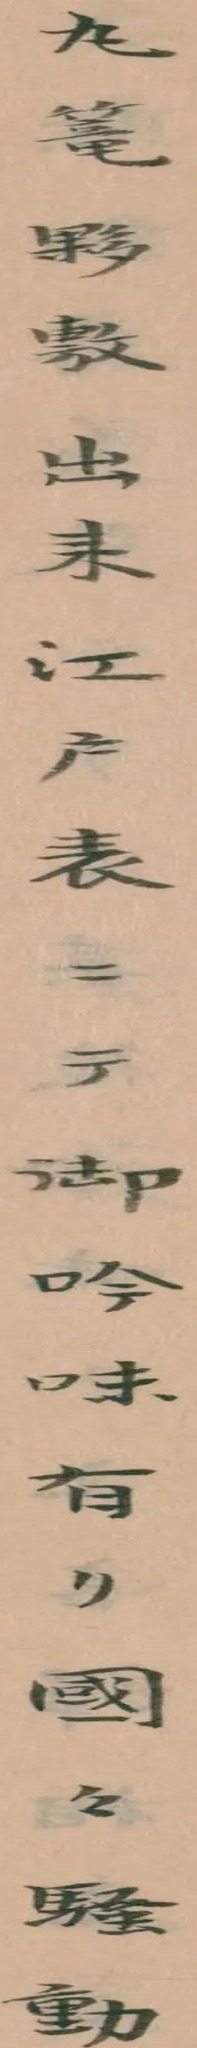丸籠夥敷出来江戸表二テ御吟味有り国々騒動
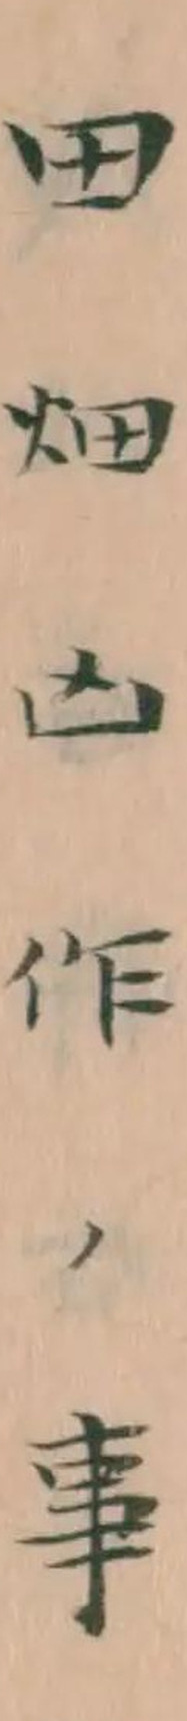田畑凶作ノ事
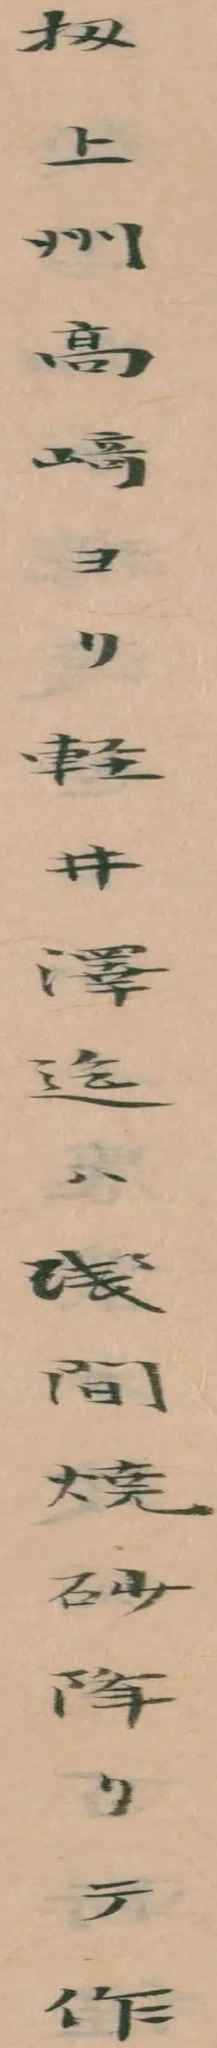扨上州高崎ヨリ軽井沢迄ハ浅間焼砂降りテ作
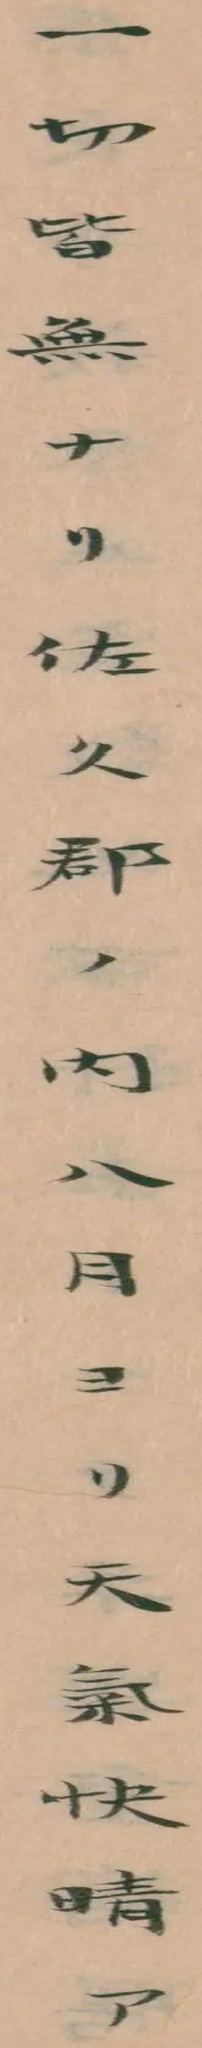一切皆無ナリ佐久郡ノ内八月ヨリ天気快晴ア
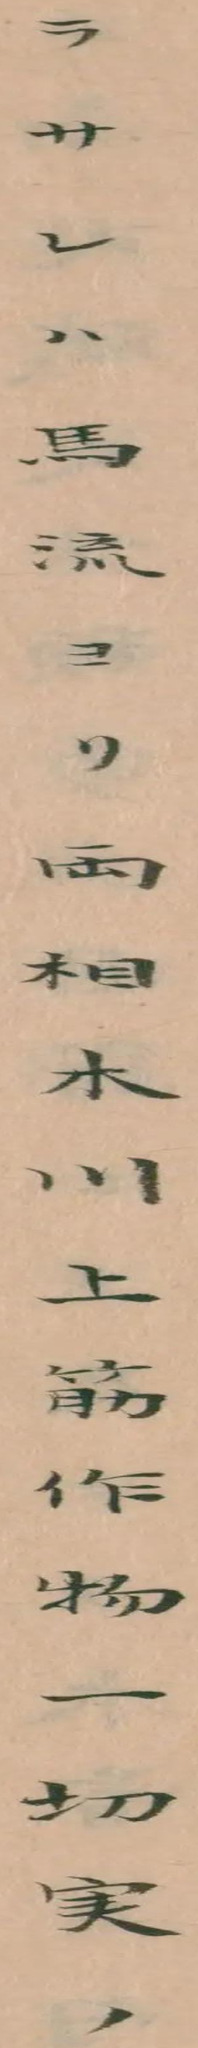ラサレハ馬流ヨリ両相木川上筋作物一切実ノ
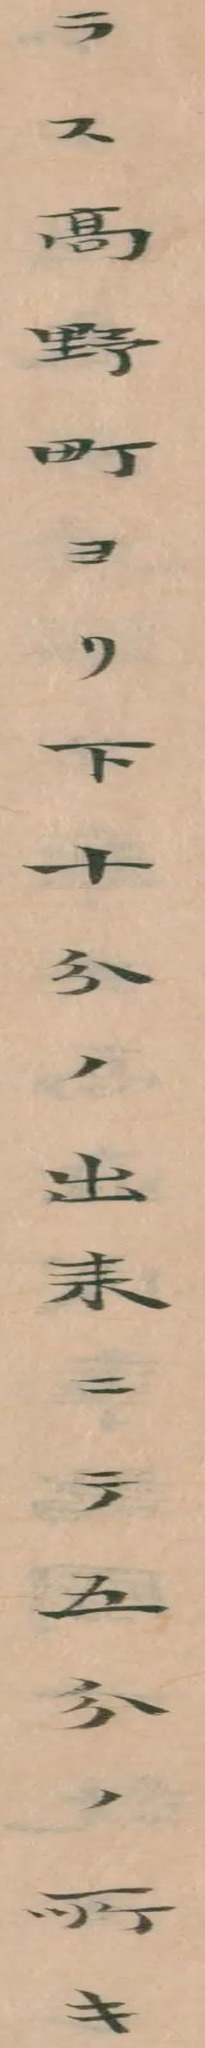ラス高野町ヨリ下十分ノ出来二テ五分ノ所キ
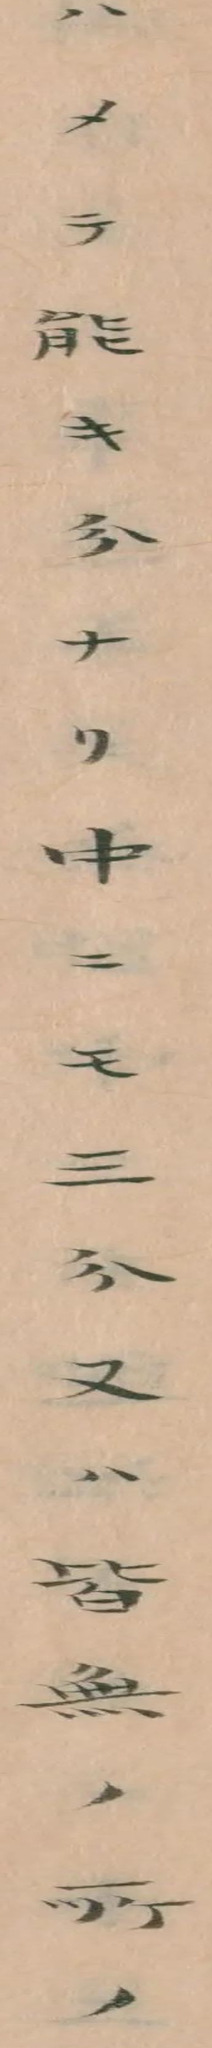ハメテ能キ分ナリ中二モ三分又ハ皆無ノ所ノ
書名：地災撮要. 巻3(地震之部)-巻4(噴火之部)
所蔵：国立国会図書館 National Diet Library, JAPAN
